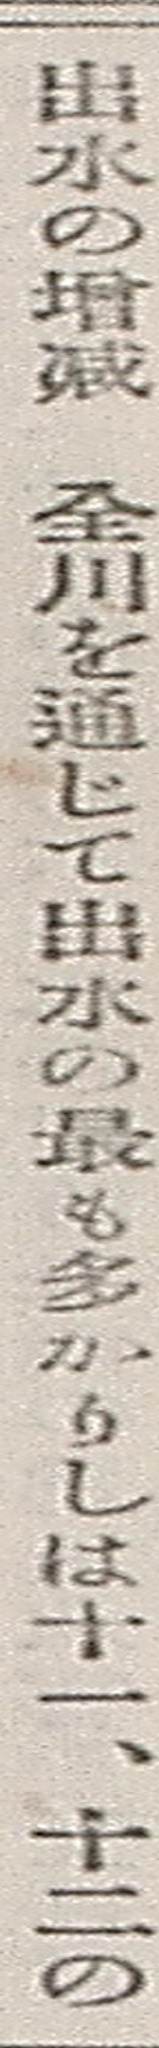出水の増減全川を通じて出水の最も多かりしは十一、十二の
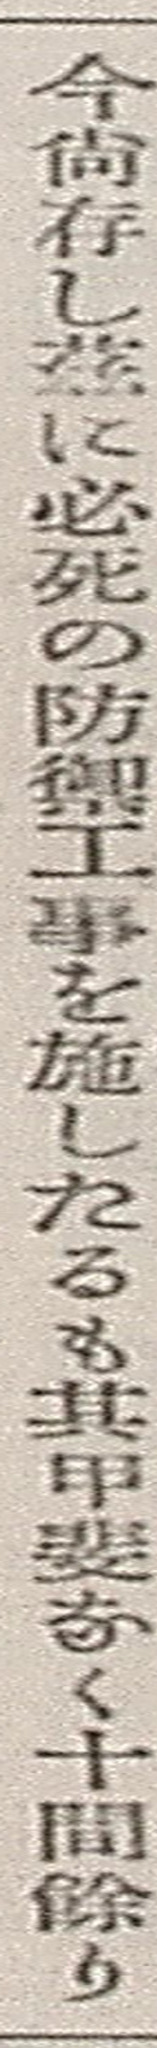今尚存し茲に必死の防禦工事を施したるも其甲斐なく十間余り
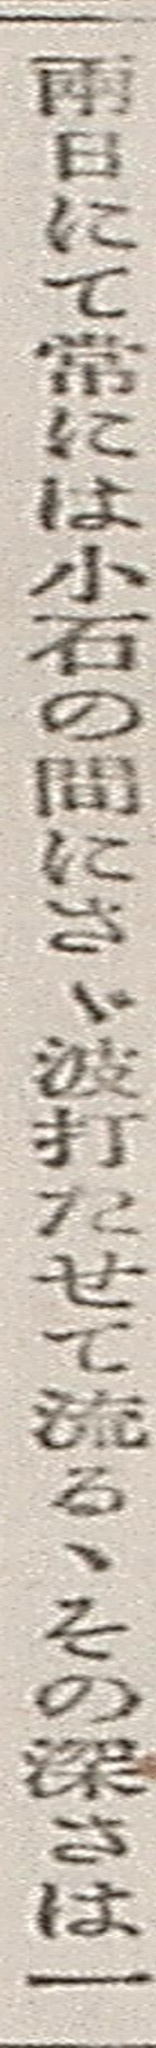両日にて常には小石の間にさゞ波打たせて流るゝその深さは一
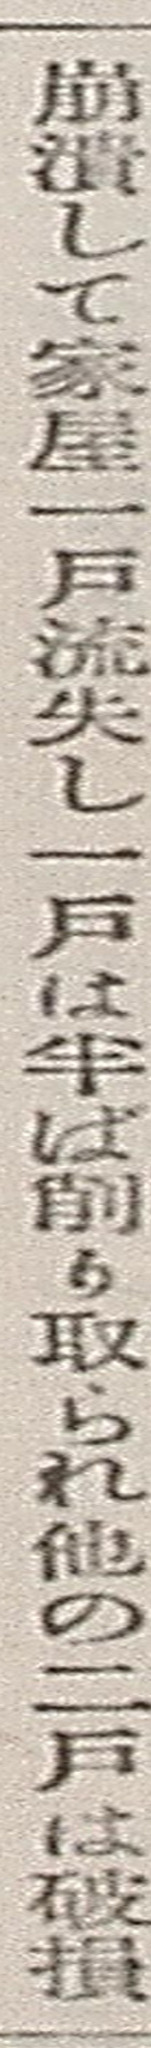崩潰して家屋一戸流失し一戸は半ば削り取られ他の二戸は破損
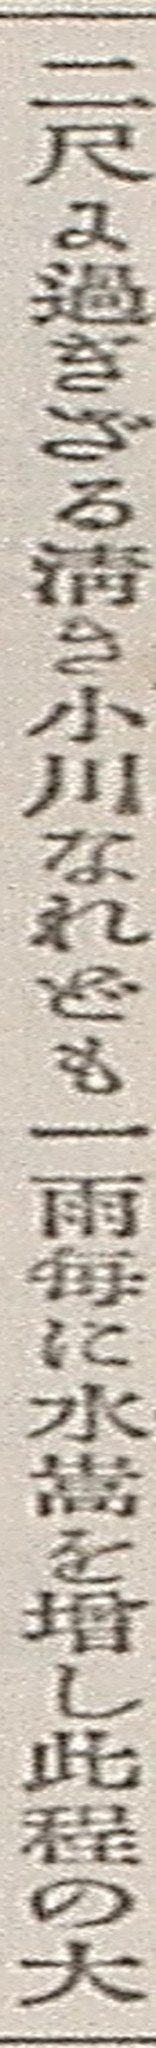二尺に過ぎざる清き小川なれども一雨毎に水嵩を増し此程の大
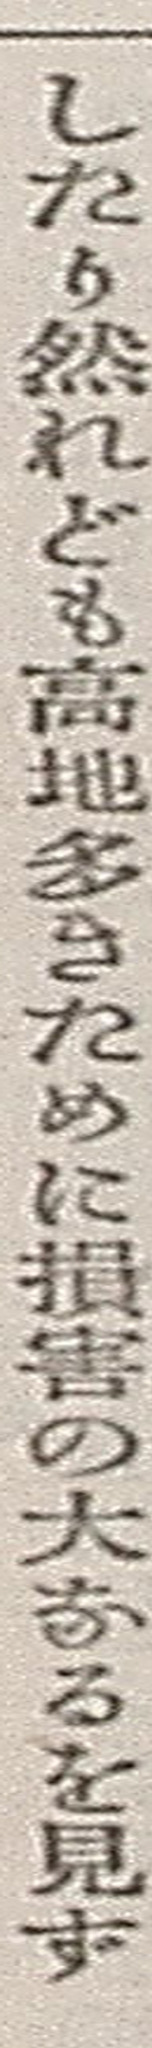したり然れども高知多きために損害の大なるを見ず
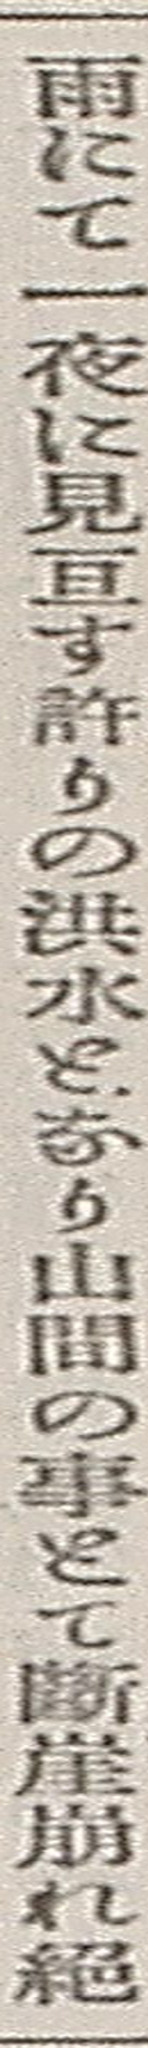雨にて一夜に見亘す許りの洪水となり山間の事とて断崖崩れ絶
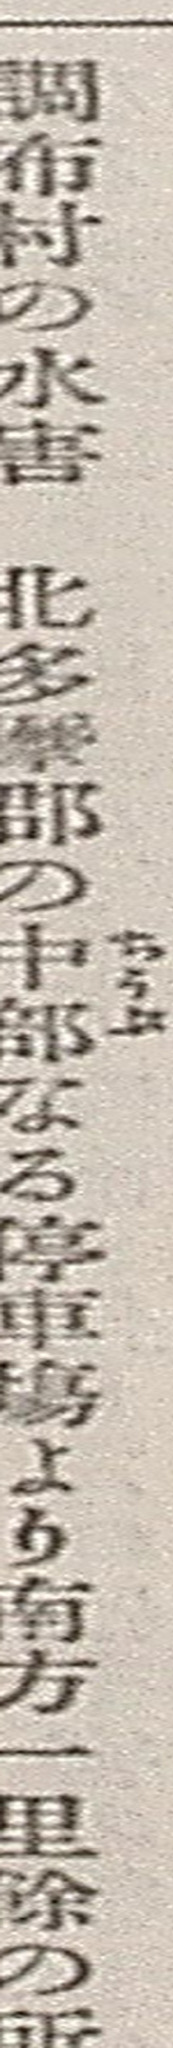調布村の水害北多摩郡の中部なる停車場より南方一里余の所
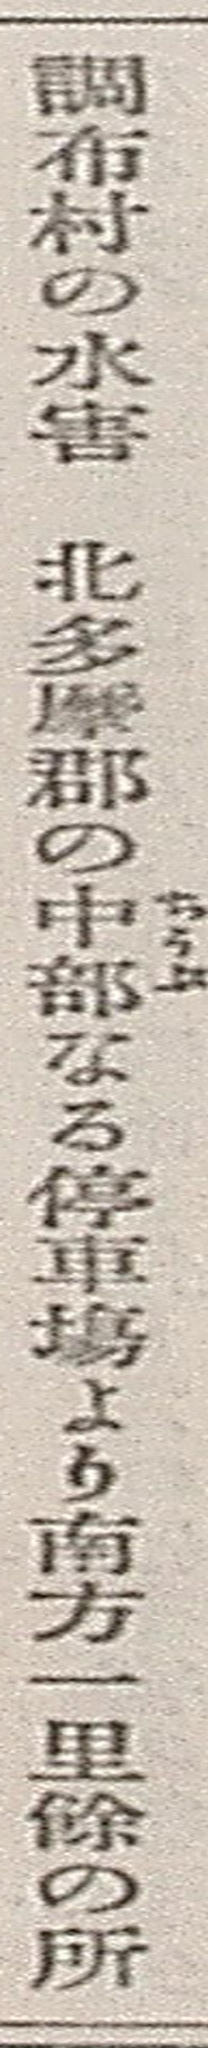調布村の水害北多摩郡の中部なる停車場より南方一里余の所
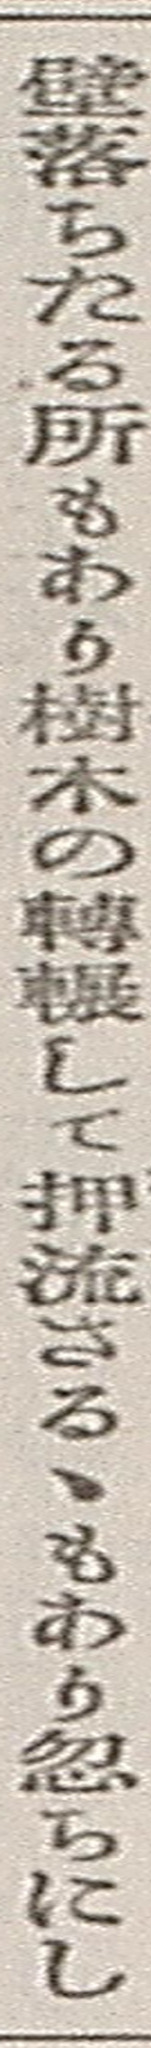壁落ちたる所もあり樹木の転輾して押流さるゝもあり忽ちにし
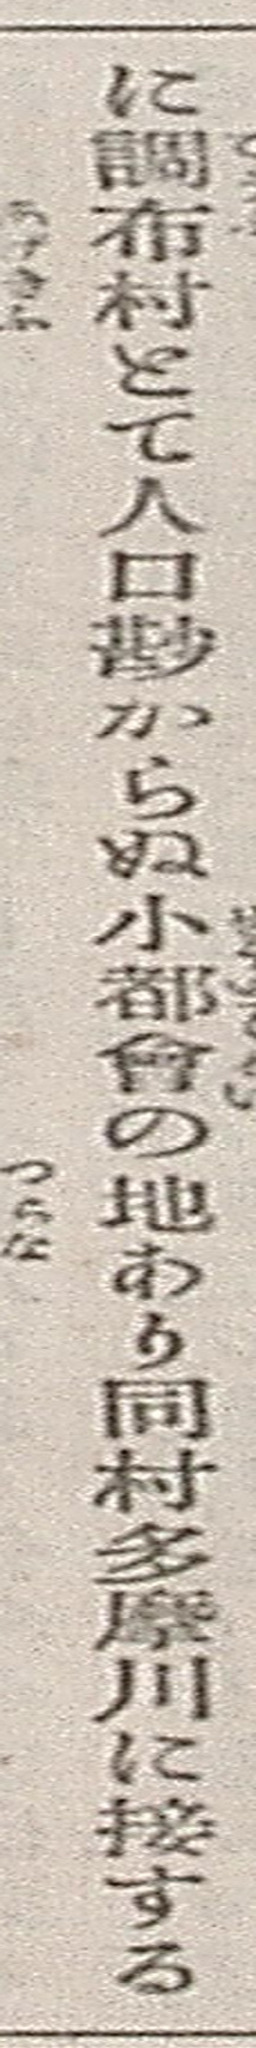に調布村とて人口少からぬ小都会の地あり同村多摩川に接する
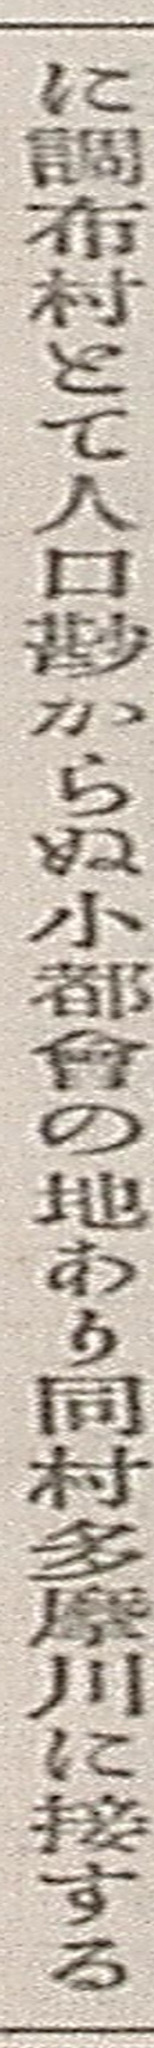に調布村とて人口少からぬ小都会の地あり同村多摩川に接する
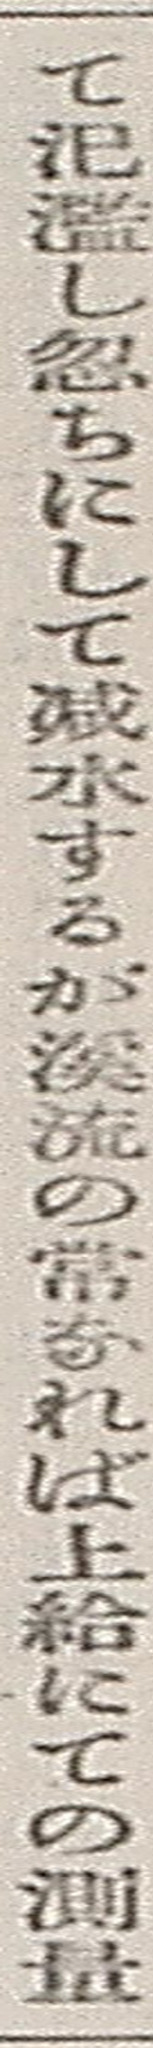て氾濫し忽ちにして減水するが渓流の常なれば上給にての測量
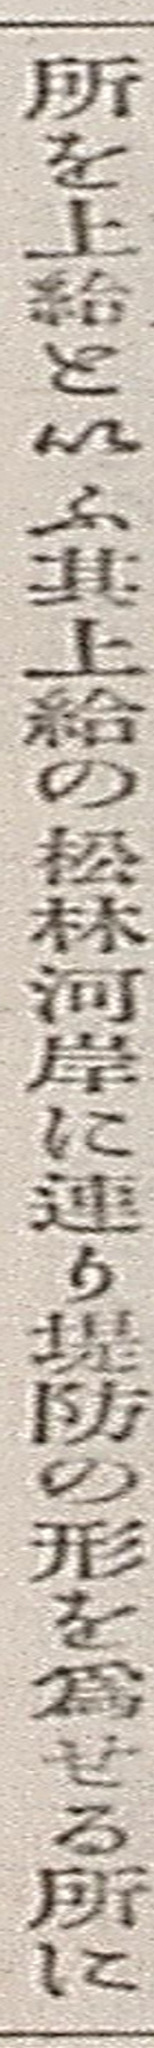所を上給といふ其上給の松林河岸に蓮り堤防の形を為せる所に
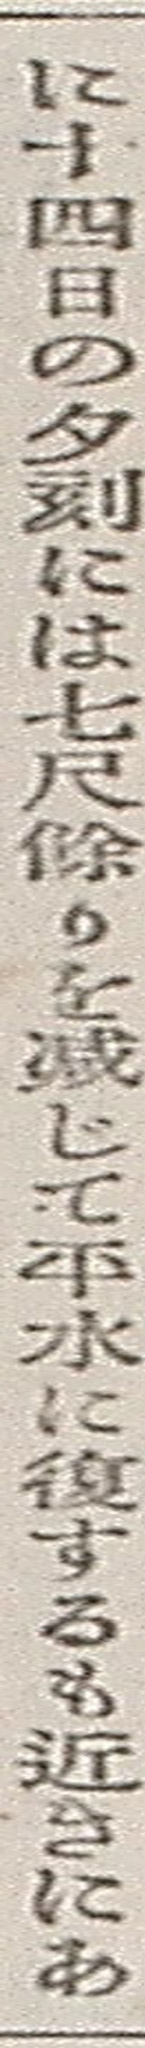に十四日の夕刻には七尺余りを減じて平水に復するも近きにあ
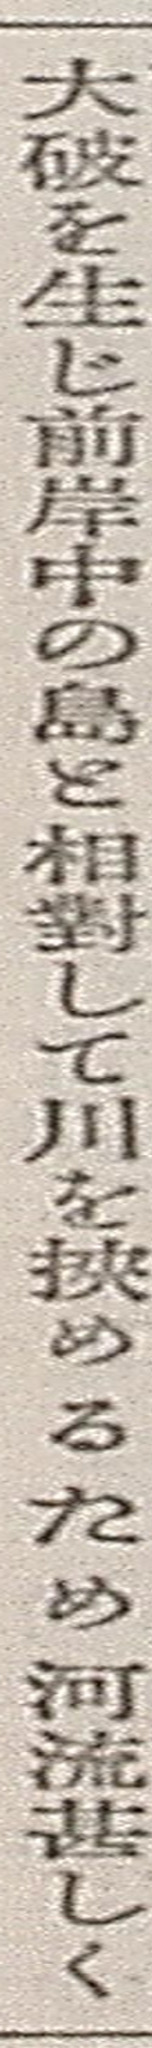大破を生じ前岸中の島と相対して川を挟めるため河流甚しく
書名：風俗畫報臨時増刊第百二十四號　洪水地震被害録（上）
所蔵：東京大学地震研究所図書室 Earthquake Research Institute Library, The University of Tokyo, JAPAN
